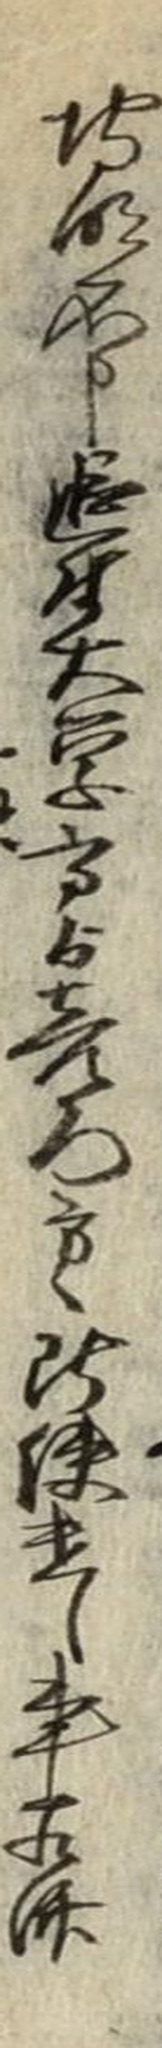埒明不申追付大学方ゟ彦右衛門方へ断使遣候事相済
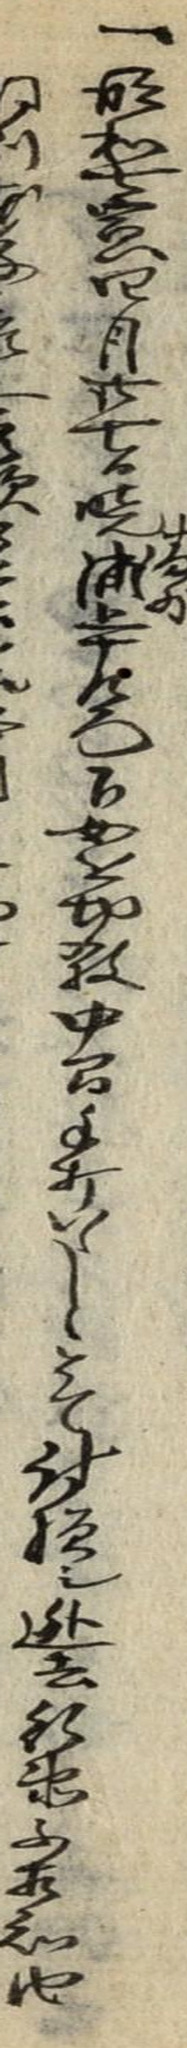一明和七寅四月廿七日暁番外浦上十左衛門下女を切殺中間手打いたし候とて討損シ逃去行衛不相知由
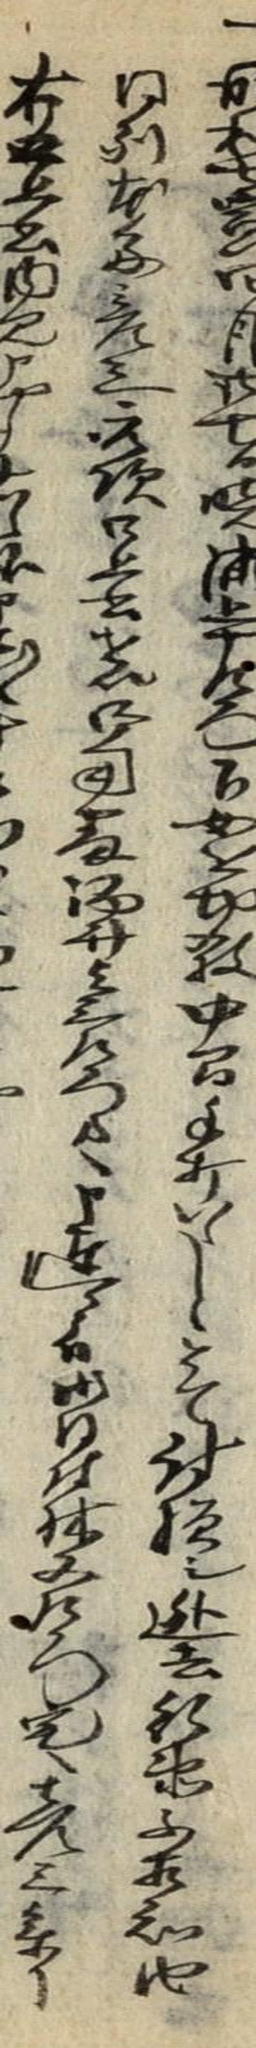同列本多彦三取次口上書を以御用番酒井与三左衛門方へ申達候に付御目付林又左衛門宅へ彦三参り
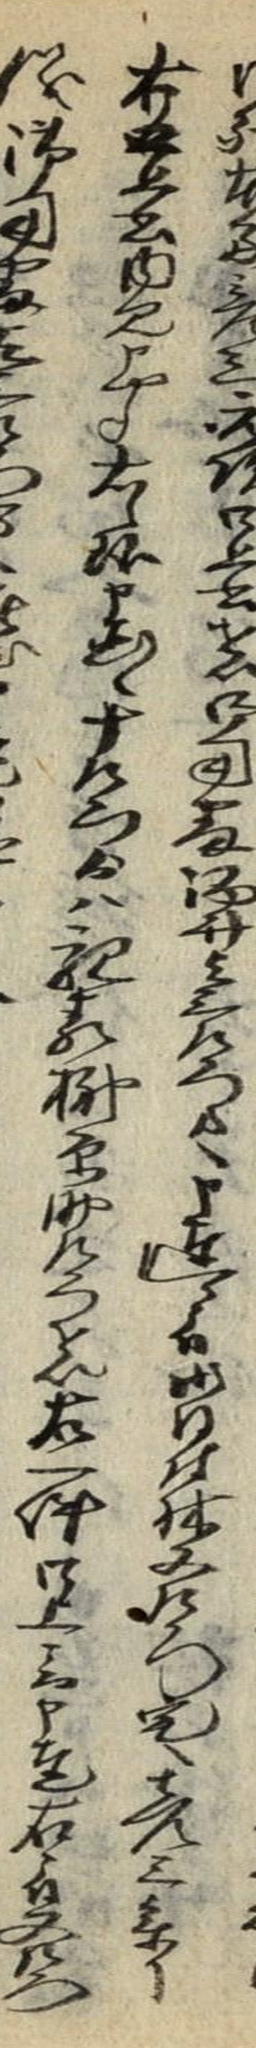右口上書内見申聞右之趣申述候十左衛門ゟは親類榊原助左衛門を以右一件口上にて申達右に付又左衛門
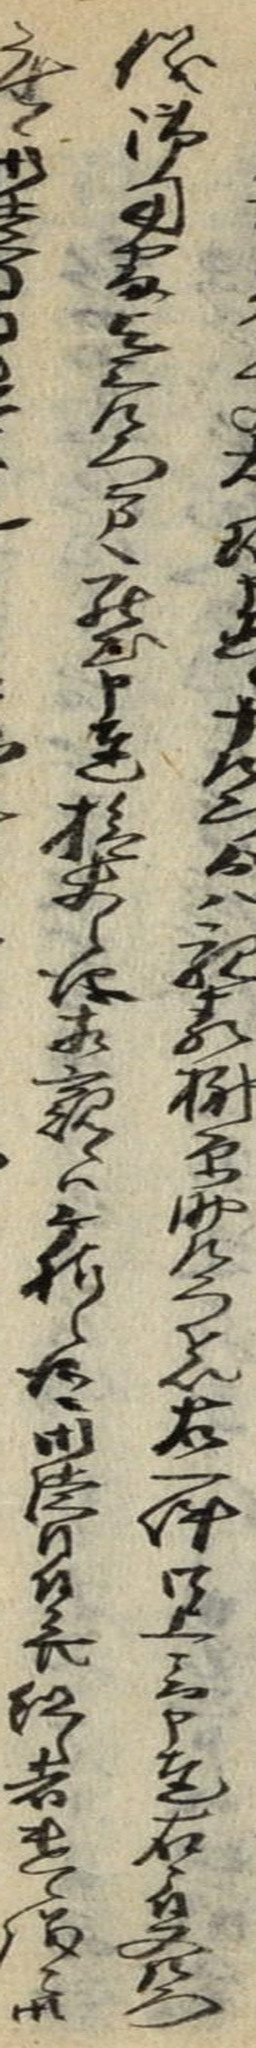儀御用番与三左衛門方へ罷出申達検使之儀相窺候はケ様之儀に御徒目付并組之者遣候儀に御
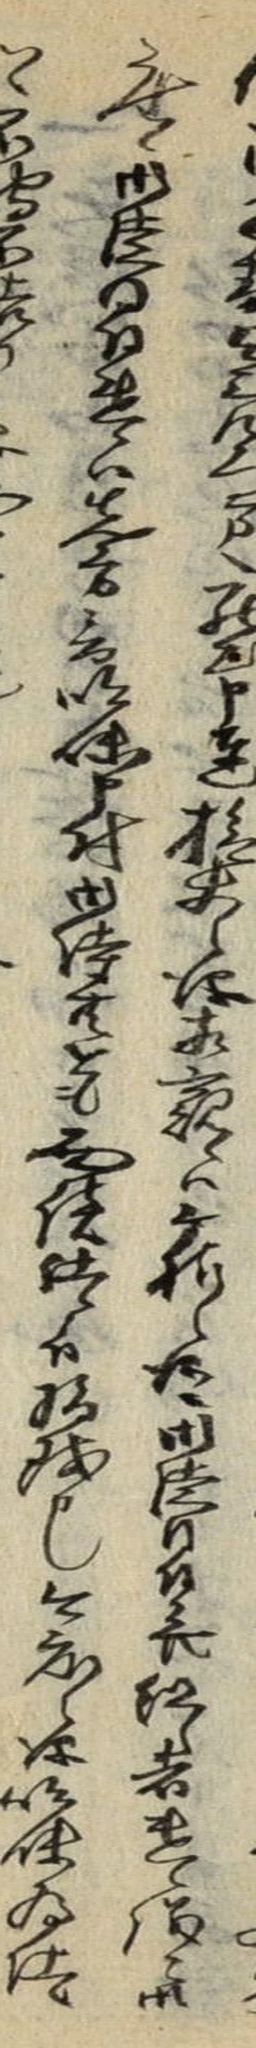座候御徒目付遣候は先方にて吟味申付御侍共とも面談仕候に付指越申候今度之儀吟味為仕候
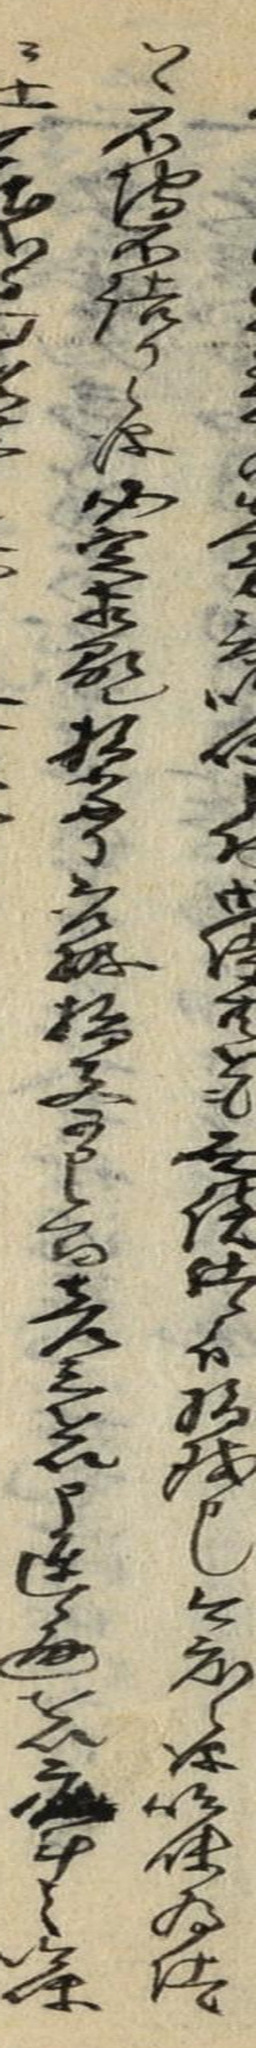はゝ不埒不詰り之儀必定相顕レ指当り取扱指支可申候間彦三を以申達候通を以疵斗之吟味
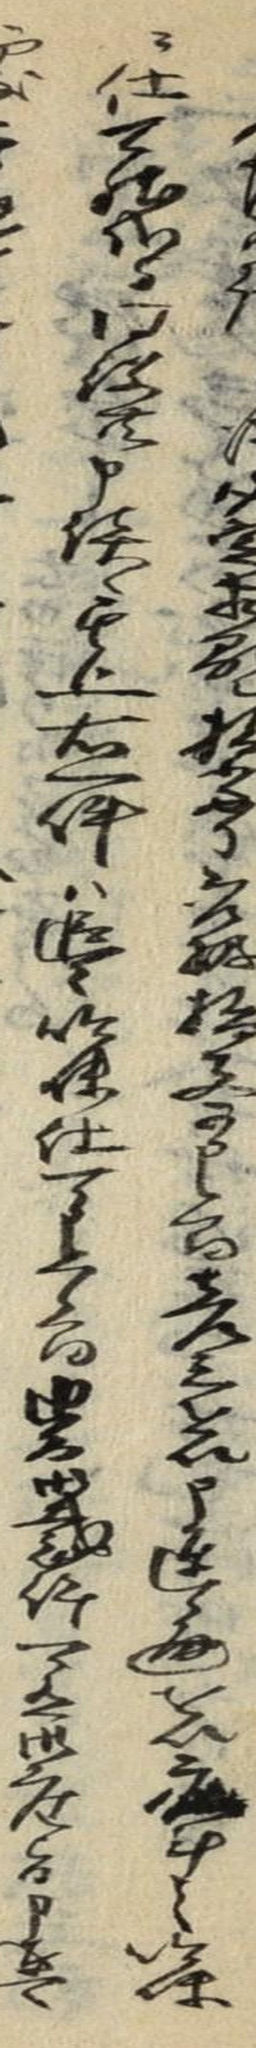に仕可然哉と同役共申談候其上右一件は追々吟味仕可申上候間追て御裁許可有御座旨申達候
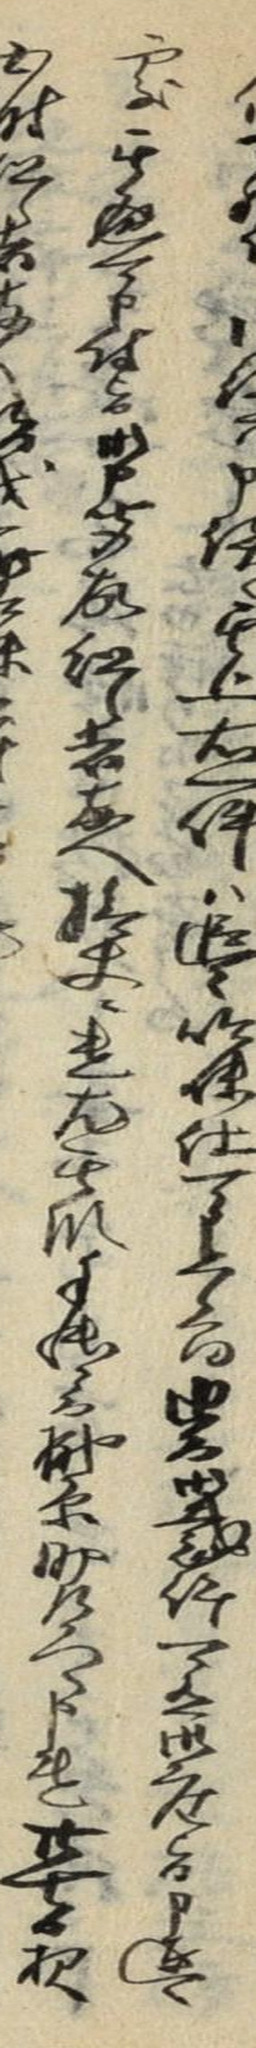処其通可申付旨御申聞故組之者両人検使に遣尤其段手紙にて榊原助左衛門へ申遣廿七日夜
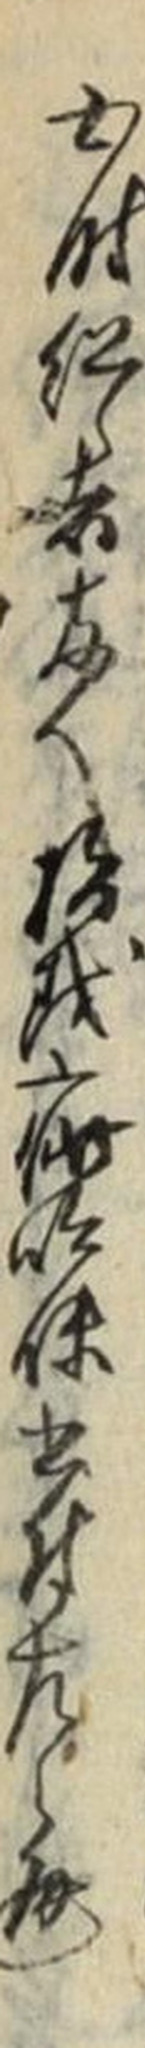五時組之者両人指越疵吟味書付左之通
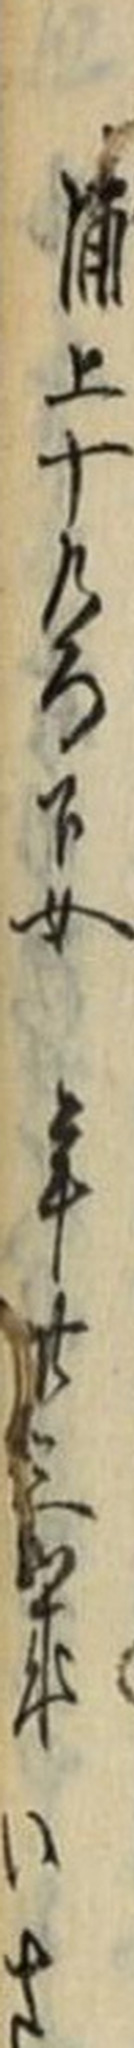浦上十左衛門下女年廿三歳いさ
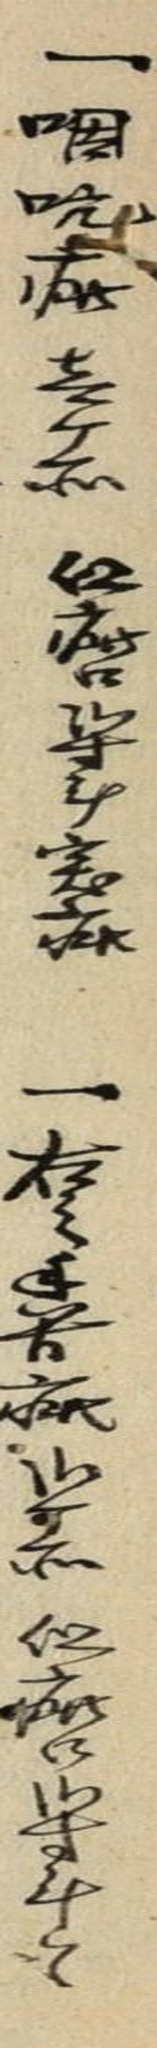一咽吭疵壱ケ所但疵口弐寸斗突疵一右之手筈疵弐ケ所但疵口弐寸斗ツヽ
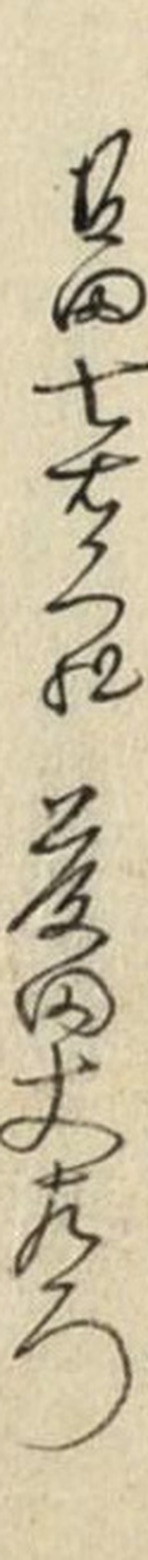坂田七右衛門組藤田丈左衛門
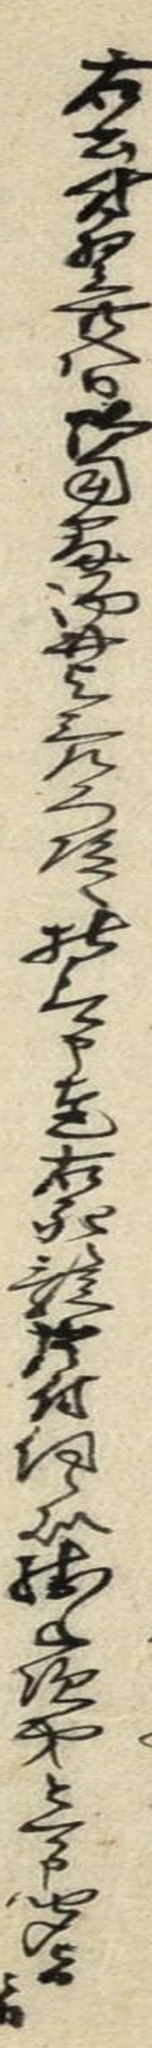右書付翌廿八日御用番酒井与三左衛門殿へ指上ヶ申達右死骸片付伺候処勝手次第と可申聞旨に付
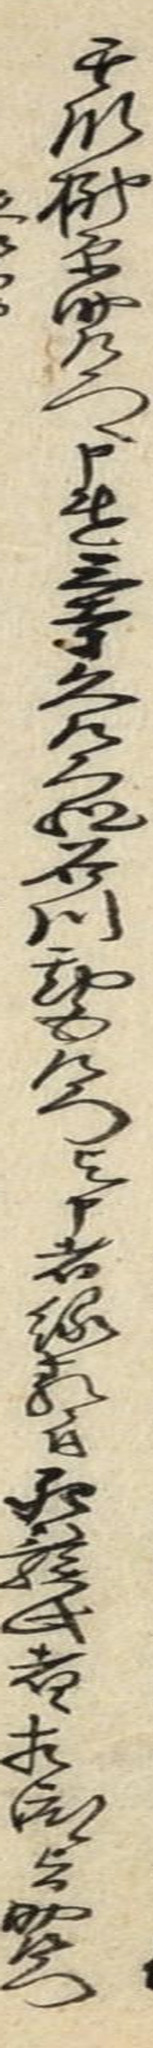其段榊原助左衛門へ申遣三寺久左衛門組谷川勘五左衛門と申者縁類に付死骸此者へ相渡候旨助左衛門
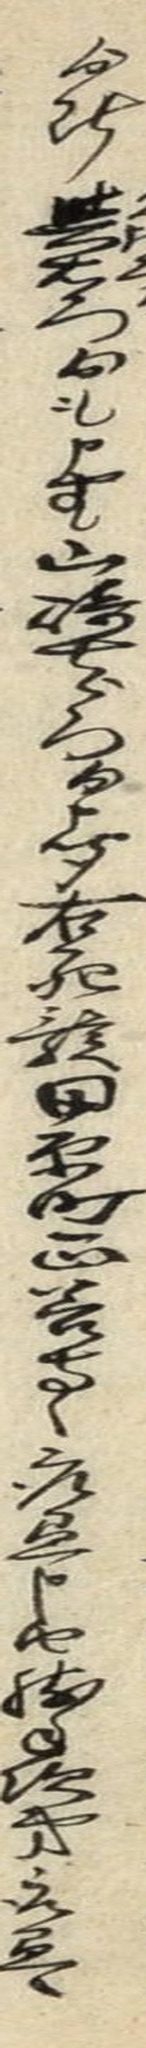ゟ断与右衛門ゟも申聞候山崎七郎右衛門ゟ申聞右死骸田原町正善寺へ取置申由勝手次第取置候
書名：御停止異変死失
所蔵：福井県文書館 Fukui Prefectural Archives
